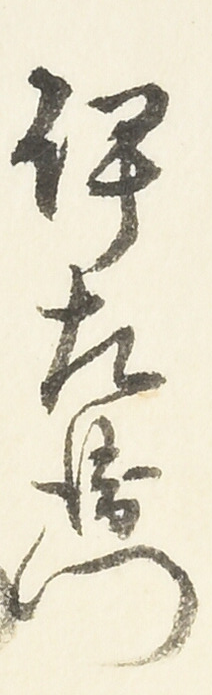仁左衛門
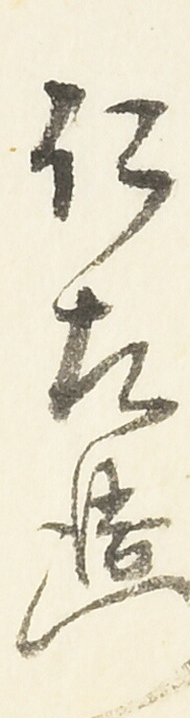仁左衛門
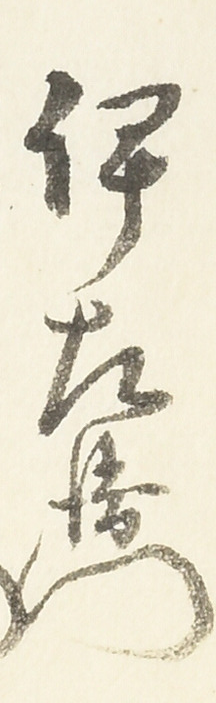仁左衛門
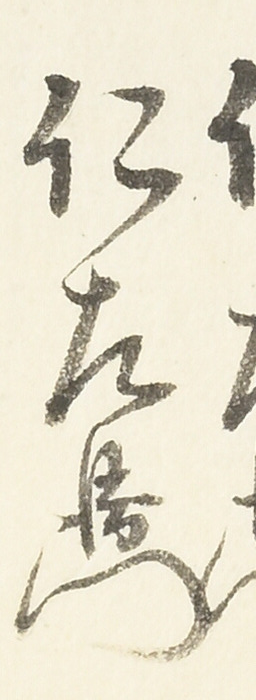仁左衛門
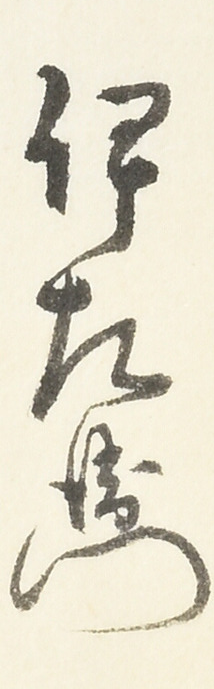仁左衛門
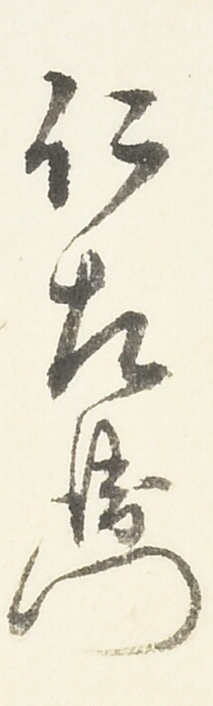仁左衛門
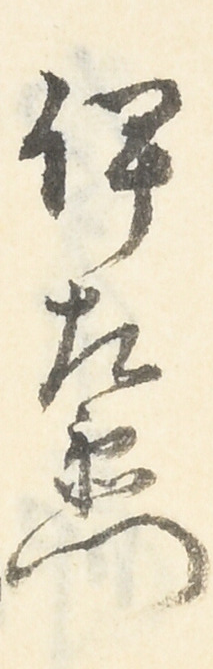仁左衛門
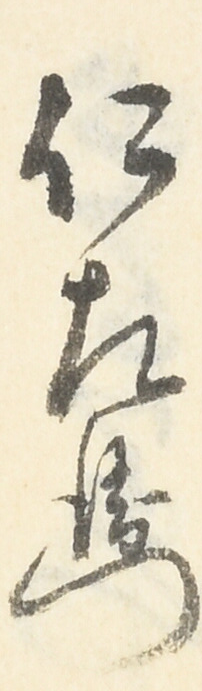仁左衛門
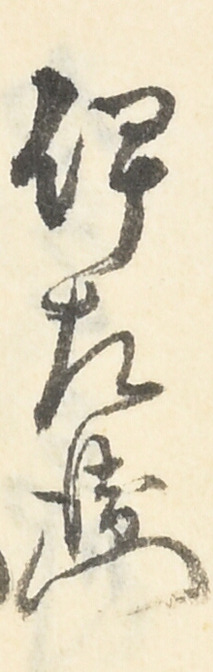仁左衛門
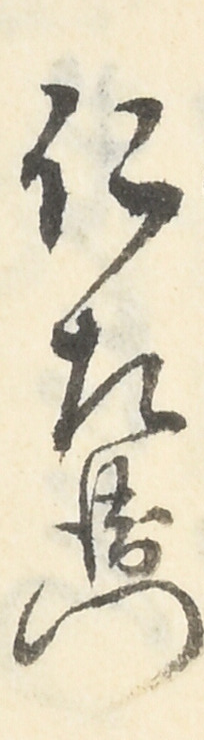仁左衛門

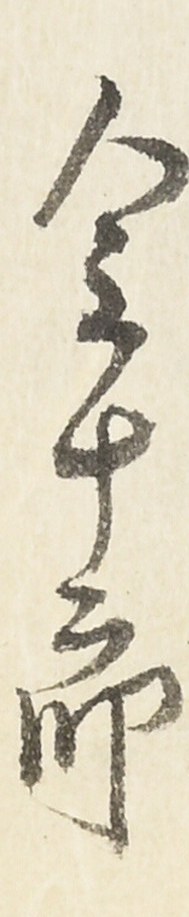金十郎
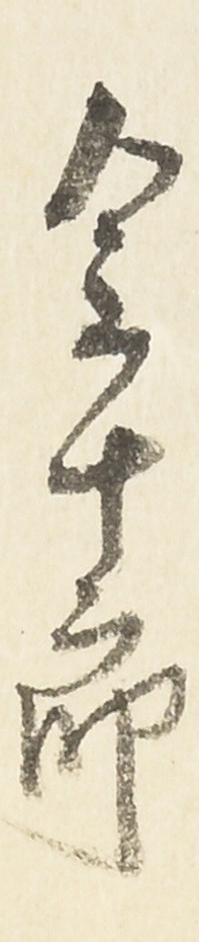金十郎
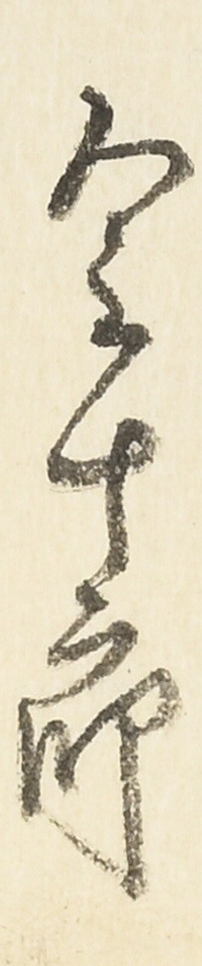金十郎
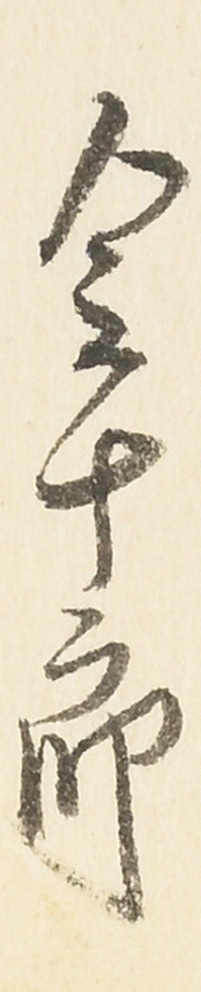金十郎
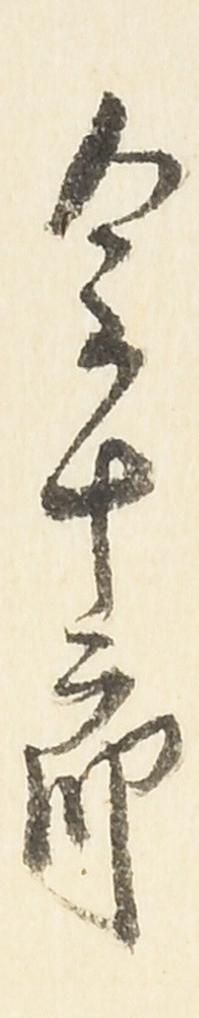金十郎
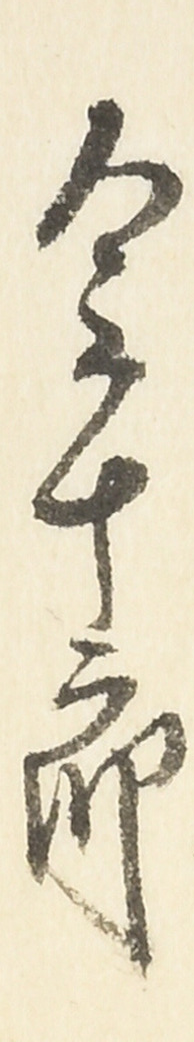金十郎
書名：鉾持町丁代勤役年歴順控
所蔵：伊那市立高遠町図書館・合同会社AMANE
